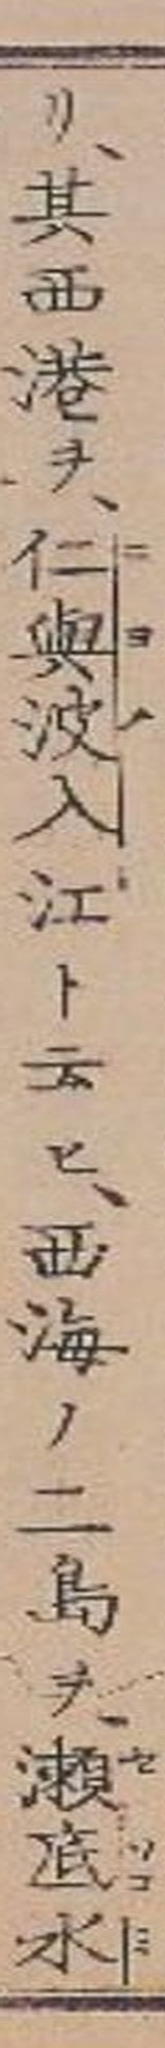リ、其西港ヲ、仁与波入江ト云ヒ、西海ノ二島ヲ、瀬底水
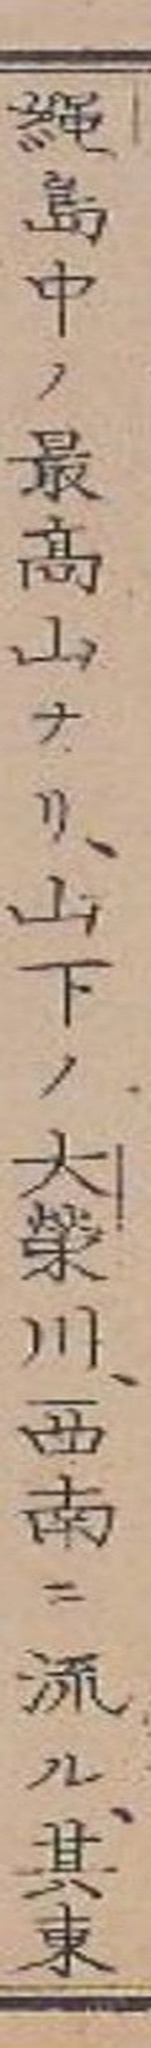縄島中ノ最高山ナリ、山下ノ大栄川、西南ニ流ル、其東
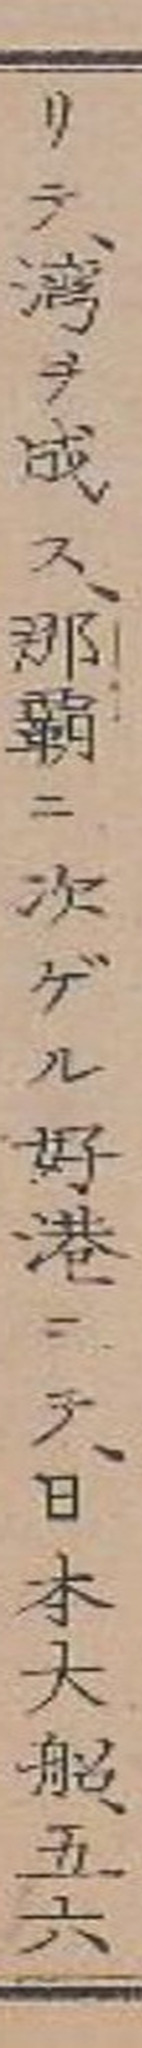リテ、湾ヲ成ス、那覇ニ次ゲル好港ニテ、日本大船、五六
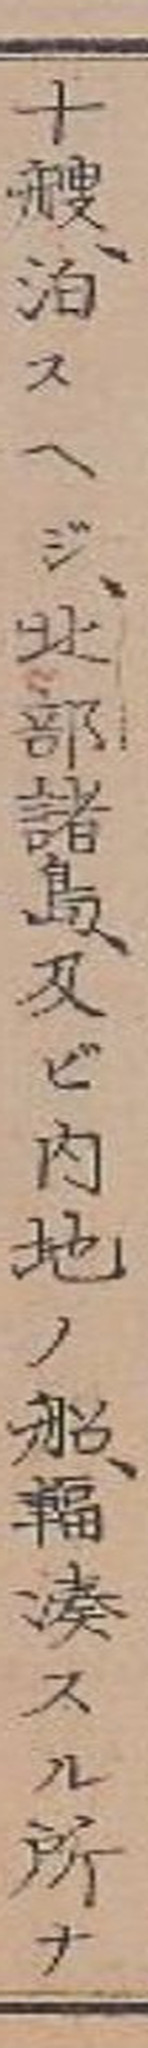十艘、泊スヘジ、北部諸島、及ビ内地ノ船、輻湊スル所ナ

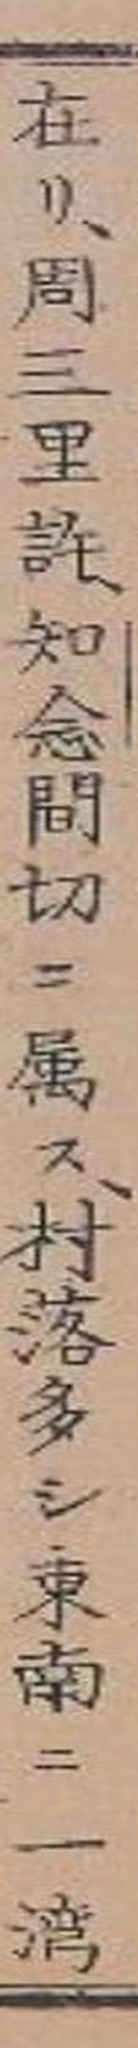在リ、周三里許、知念間切ニ属ス、村落多シ東南ニ一湾
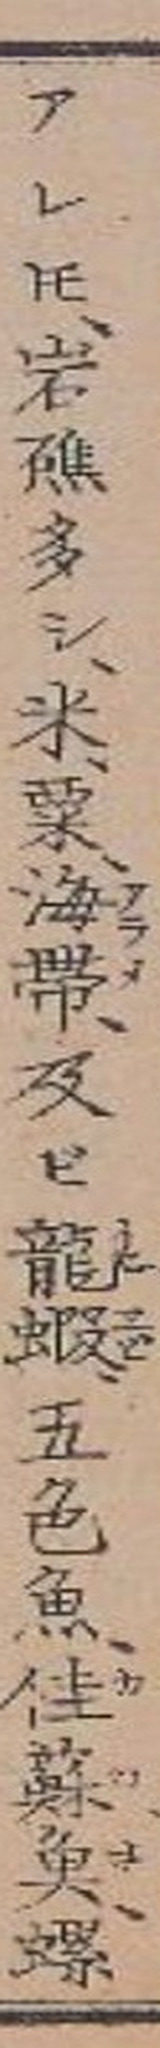アレトモ、岩礁多シ、米、粟、海帯、及ビ竜蝦、五色魚、佳蘇魚、螺
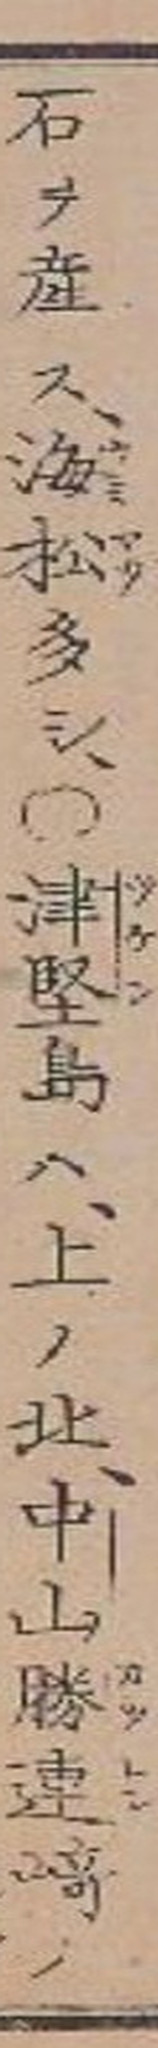石ヲ産ス、海松多シ、○津堅島ハ、上ノ北、中山勝連崎ノ
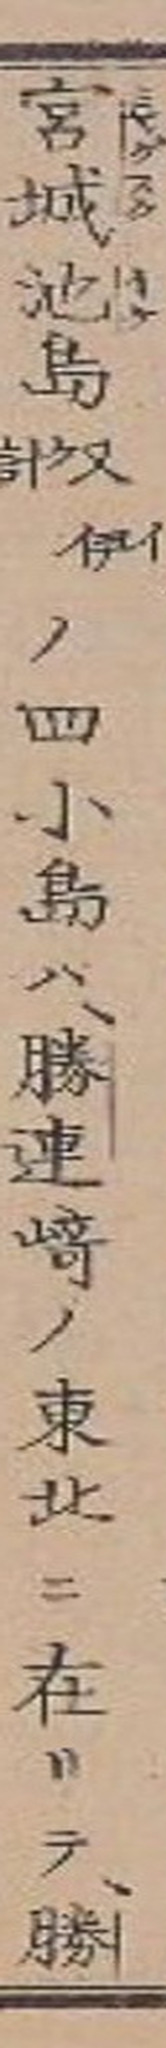宮城池島又伊計ノ四小島ハ、勝連崎ノ東北ニ在リテ、勝
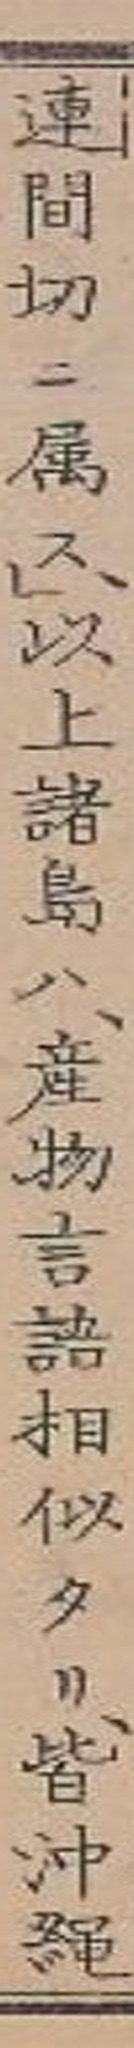連間切ニ属ス、」以上諸島ハ、産物言語相似タリ、皆沖縄
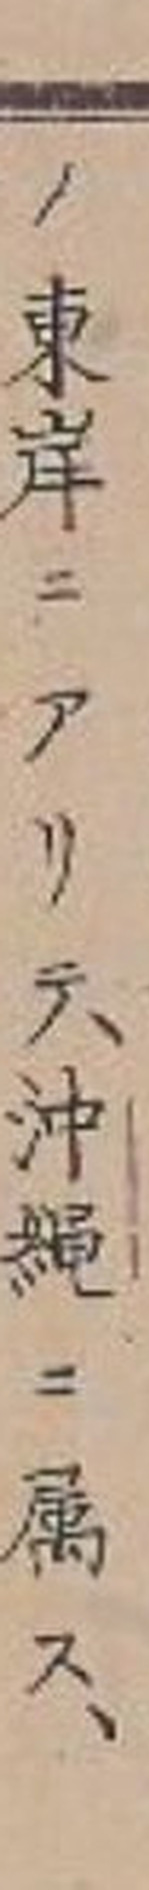ノ東岸ニアリテ、沖縄ニ属ス、
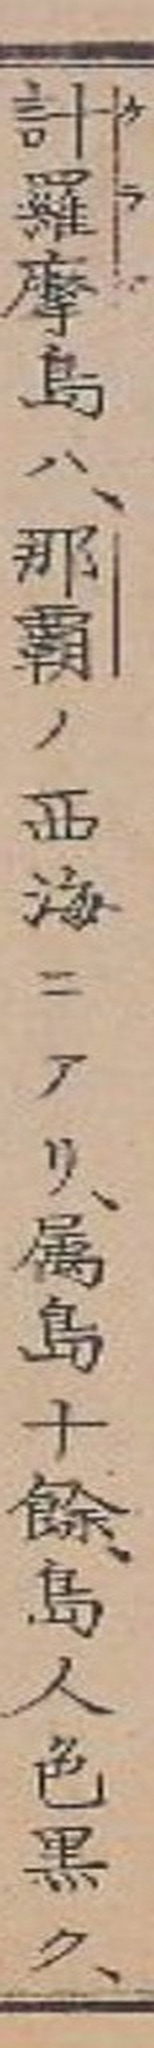計羅摩島ハ、那覇ノ西海ニアリ、属島十余、島人色黒ク、
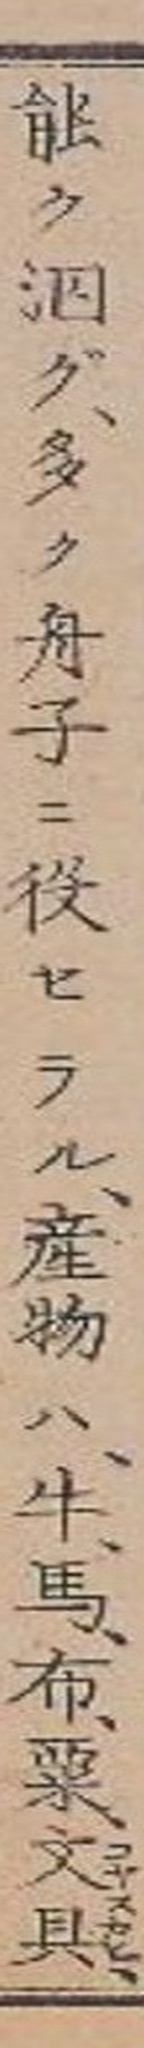能ク泅グ、多ク舟子ニ役セラル、産物ハ、牛、馬、布、粟、文貝、
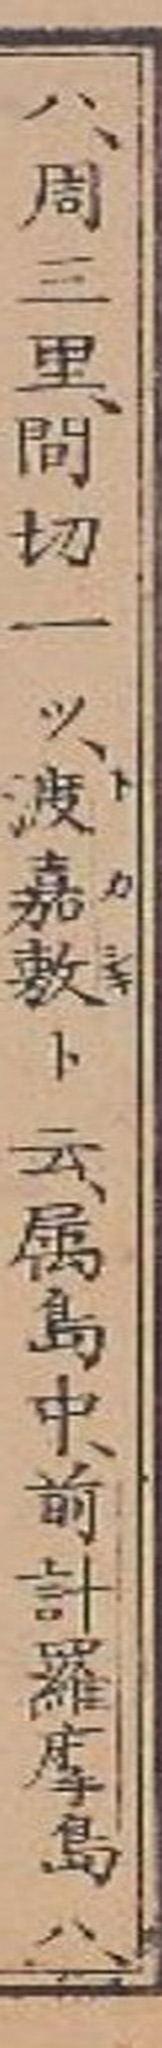ハ、周三里、間切一ツ、渡嘉敷ト云、属島中、前計羅摩島ハ、
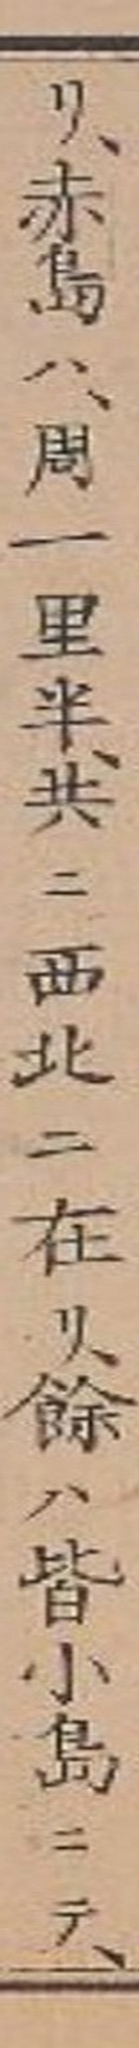リ、赤島ハ、周一里半、共ニ西北ニ在リ、余ハ皆小島ニテ、
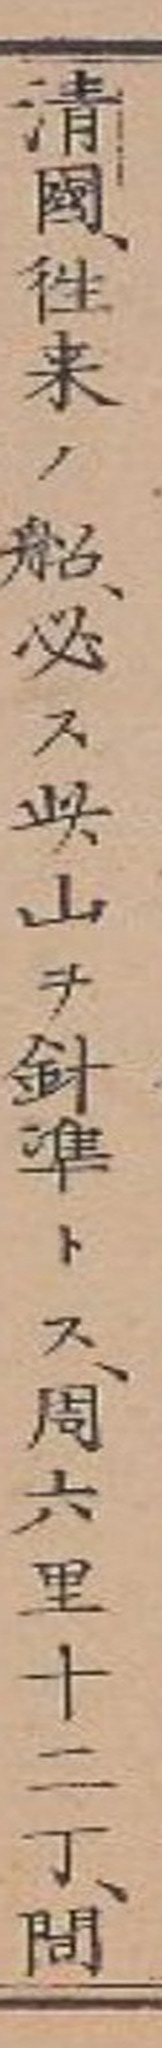清国、往来ノ船、必ス此山ヲ針準トス、周六里十二丁、間
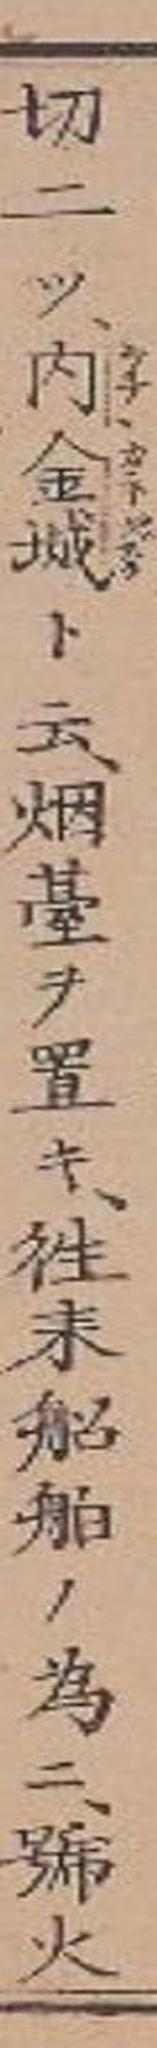切二ツ、内、金城ト云、煙台ヲ置キ、往来船舶ノ為ニ、号火
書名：琉球新誌 巻上
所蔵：University of the Ryukyus Library
